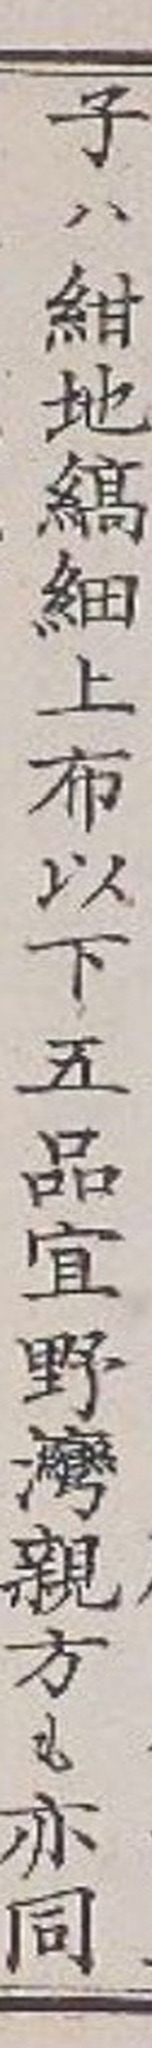子は紺地縞細上布以下五品宜野湾親方も亦同
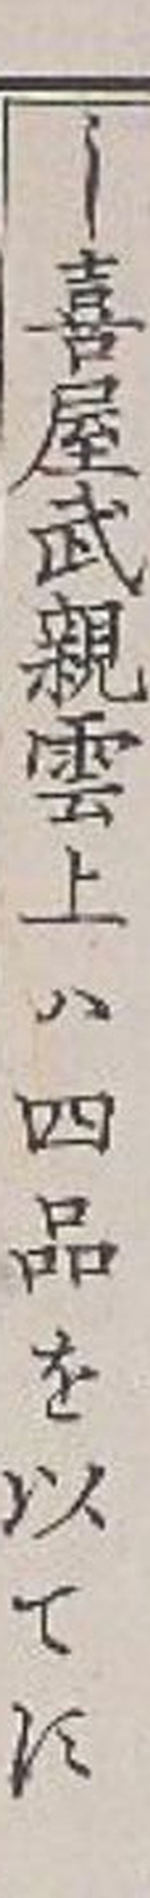し喜屋武親雲上は四品を以てす
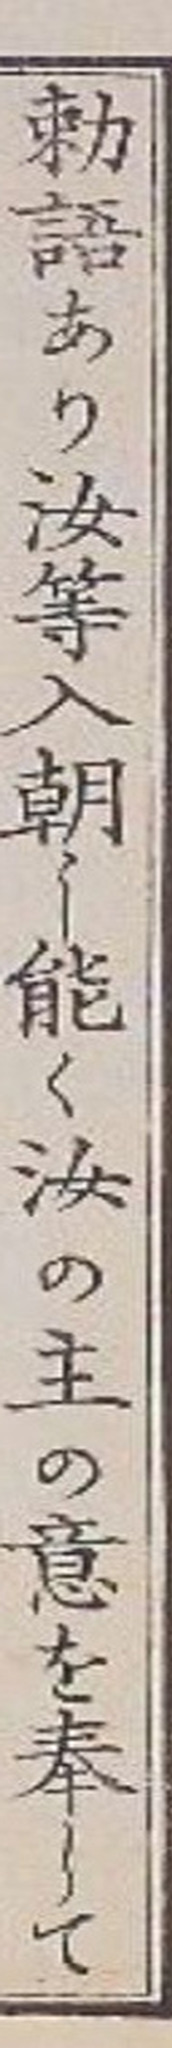勅語あり汝等入朝し能く汝の主の意を奉して
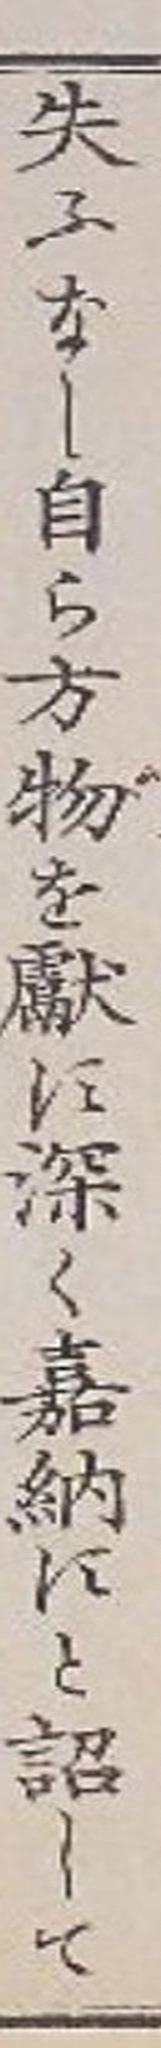失ふなし自ら方物を献す深く嘉納すと詔して
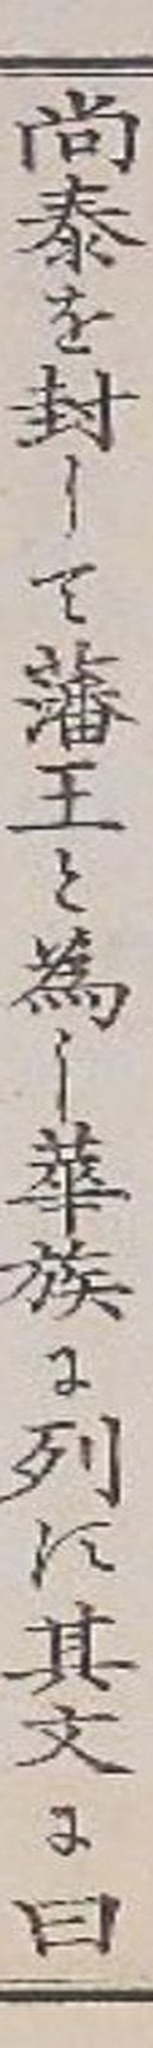尚泰を封して藩王と為し華族に列す其文に曰
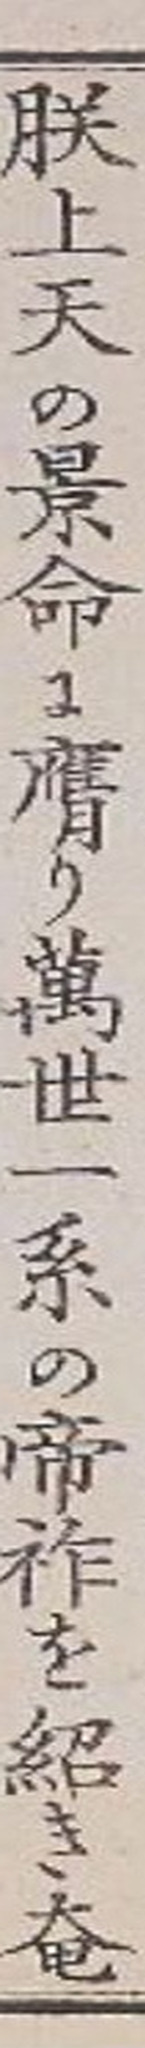朕上天の景命に膺り万世一系の帝柞を紹き奄
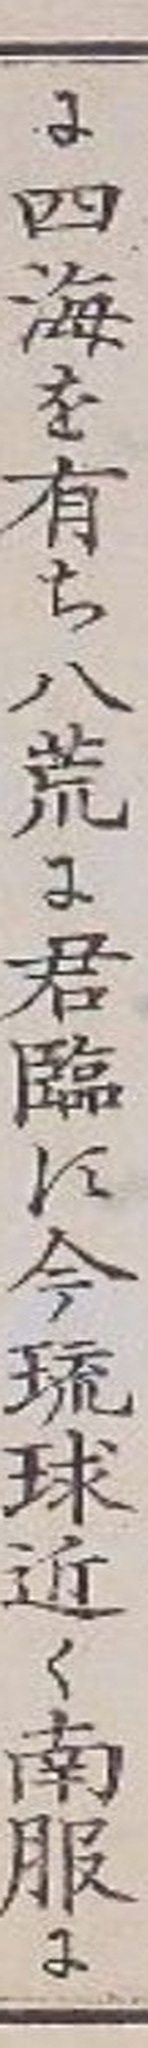に四海を有ち八荒に君臨す今琉球近く南服に
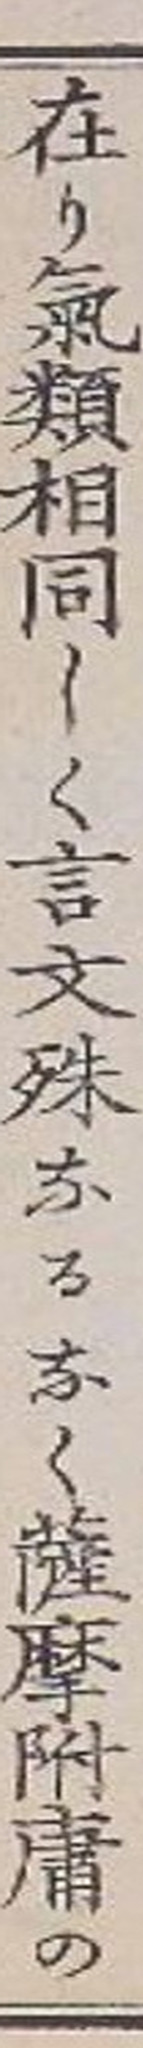在り気類相同しく言文殊なるなく薩摩付庸の
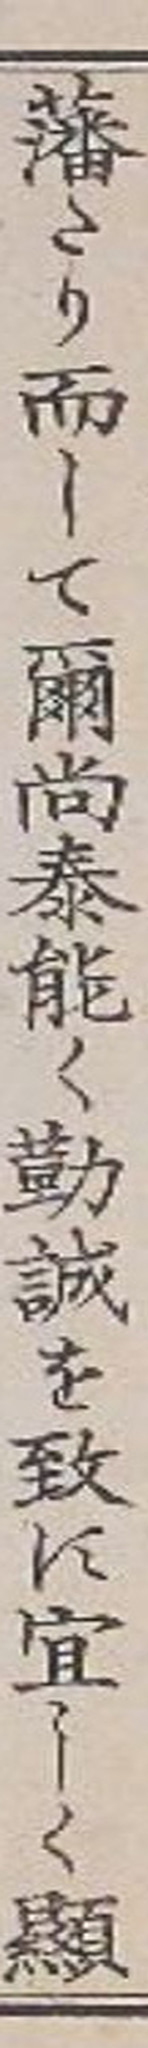藩たり而して爾尚泰能く勤誠を致す宜しく顕
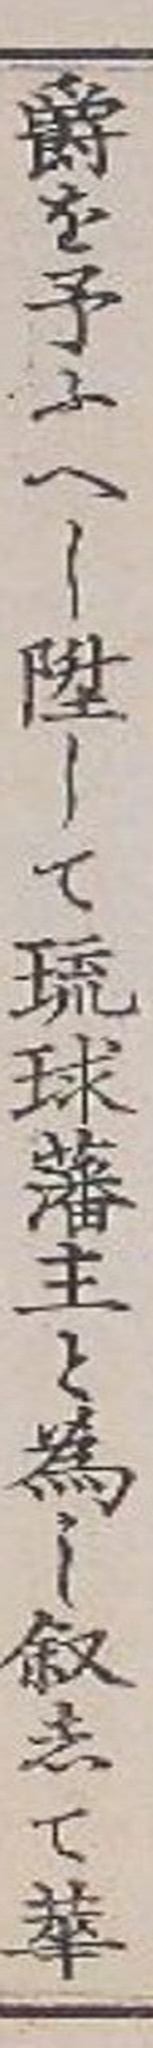爵を予ふへし昇して琉球藩主と為し叙して華
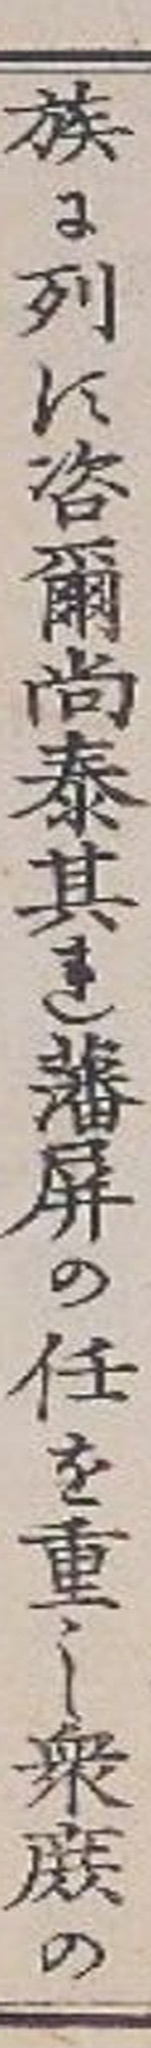族に列す諮爾尚泰其れ藩屏の任を重し衆庶の
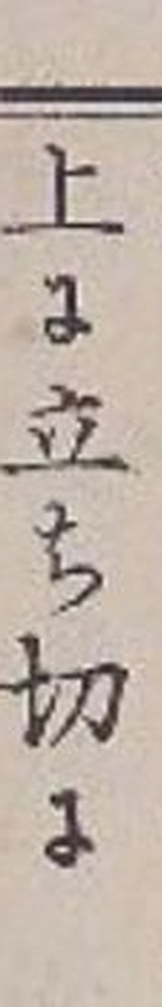上に立ち切に

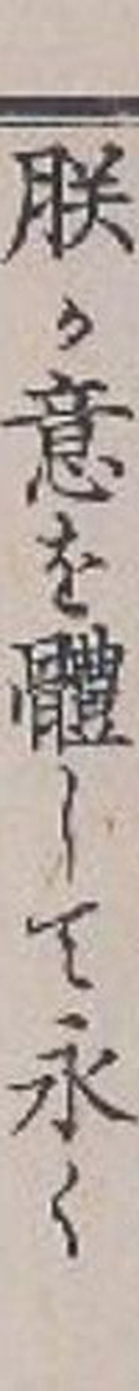朕か意を体して永く
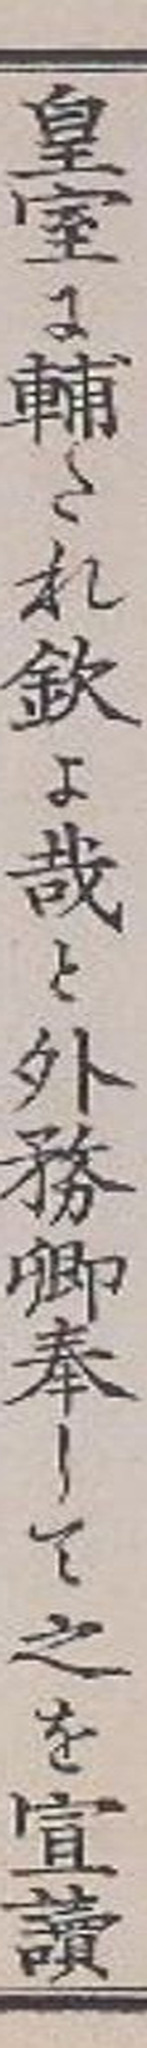皇室に輔たれ欽よ哉と外務卿奉して之を宣読
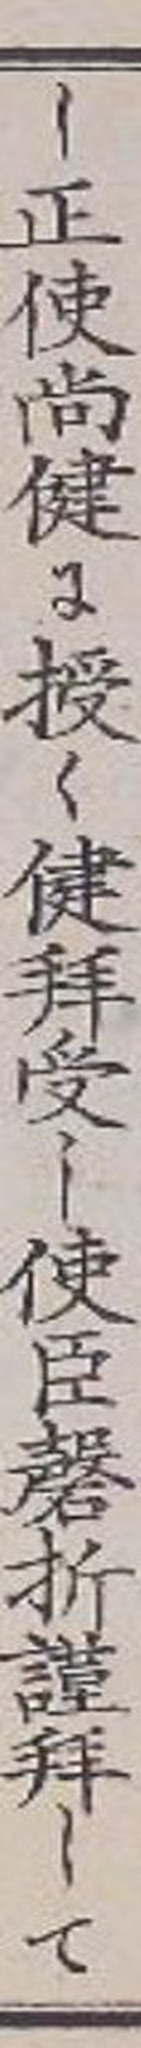し正使尚健に授く健拝受し使臣磬折謹拝して
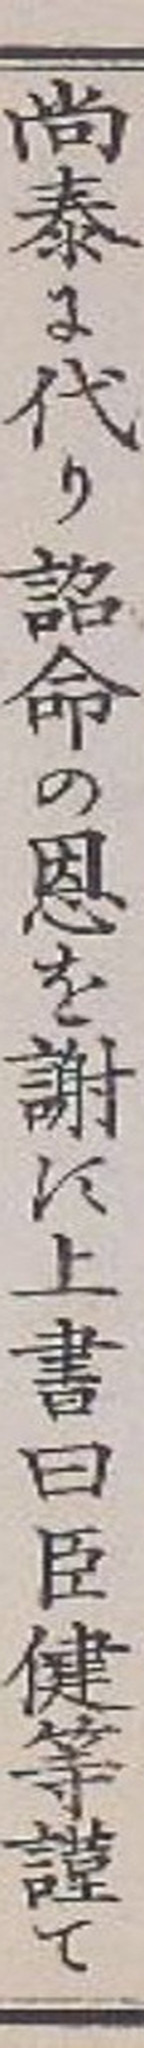尚泰に代り詔命の恩を謝す上書曰臣健等謹て
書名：南島紀事 下
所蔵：University of the Ryukyus Library
